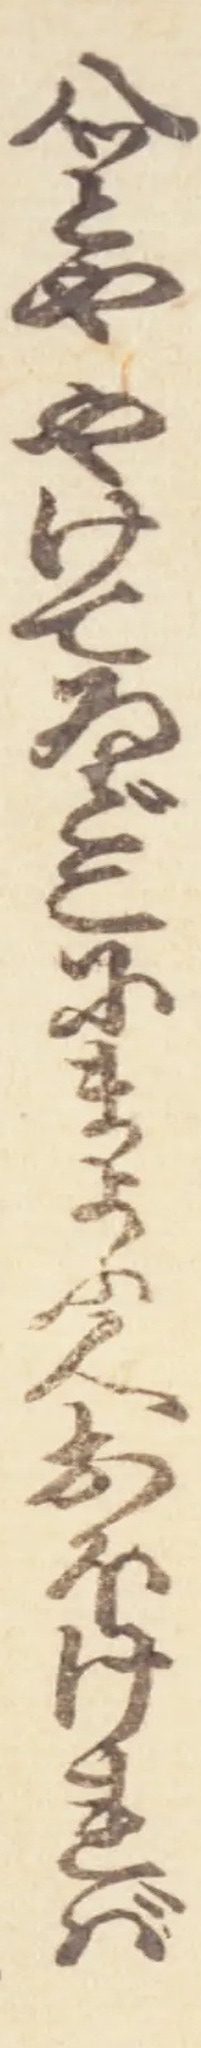八ツとややけてゐどこにまよふ人おほければ
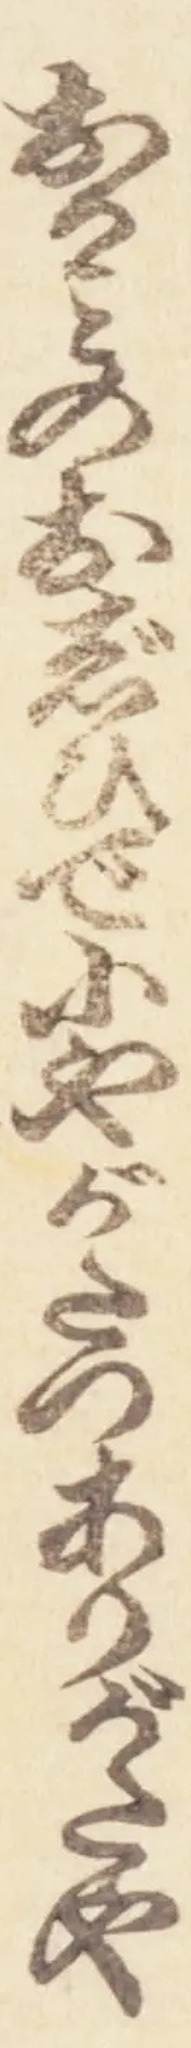おかみのおじひで小やがたつありがたや
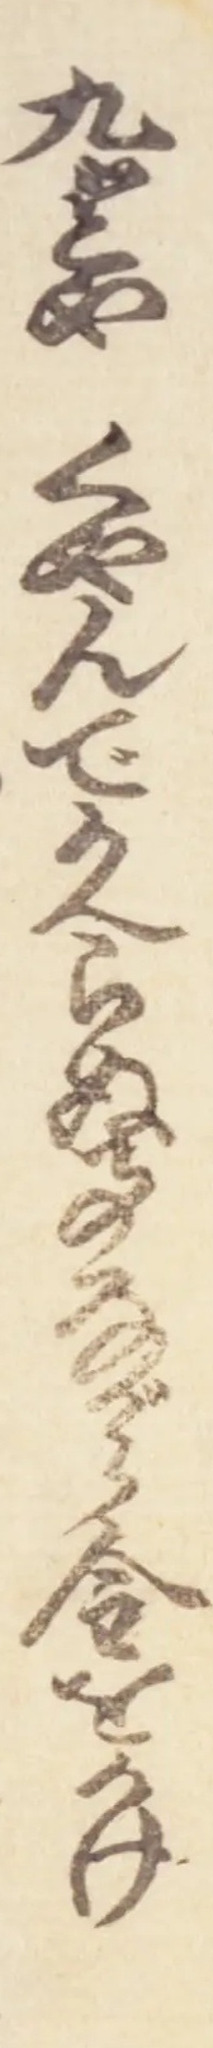九ツとやくやんでかへらぬ事ながら金をかけ
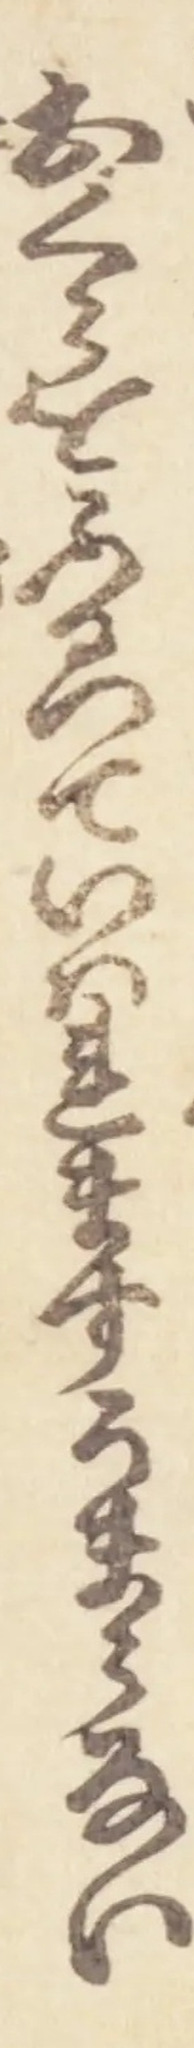おくらをふるつていはれますうまらない
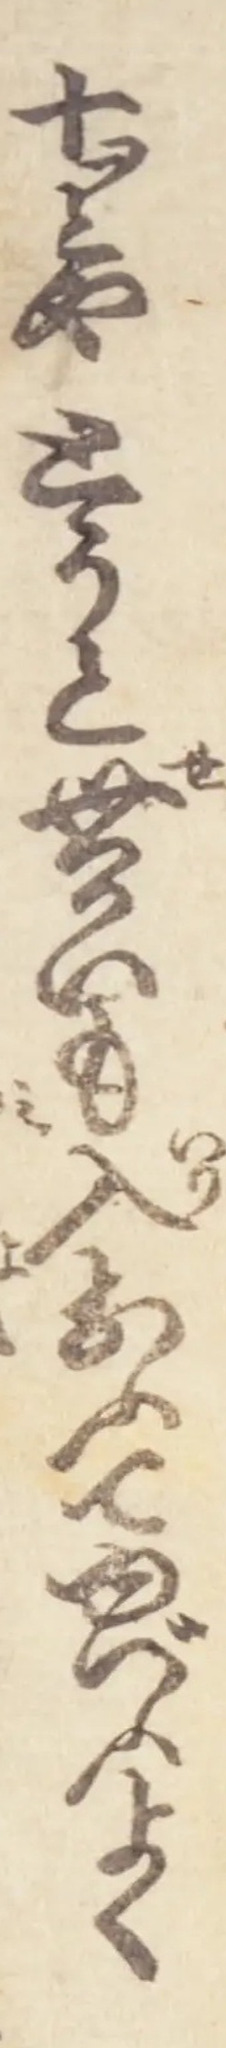十ツとやとうと世かいも入おふてゆづふよく
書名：地震鞠うた
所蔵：国立国会図書館 National Diet Library, JAPAN
